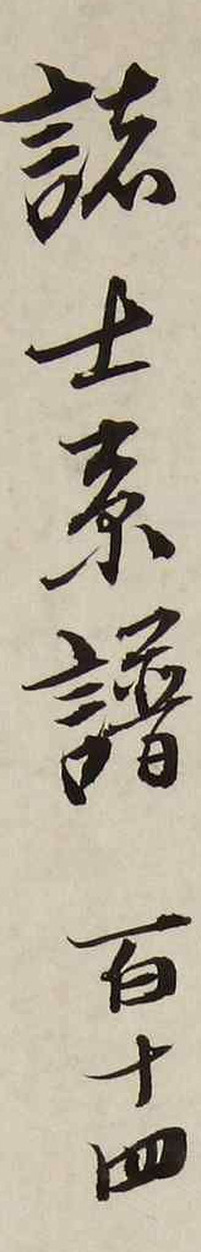諸士系譜百十四

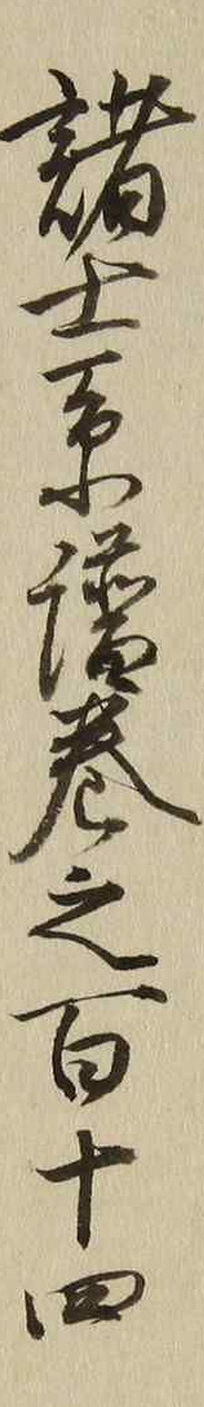諸士系譜卷之百十四
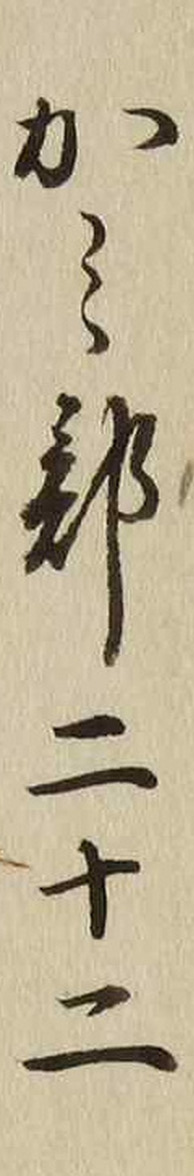か之部二十二
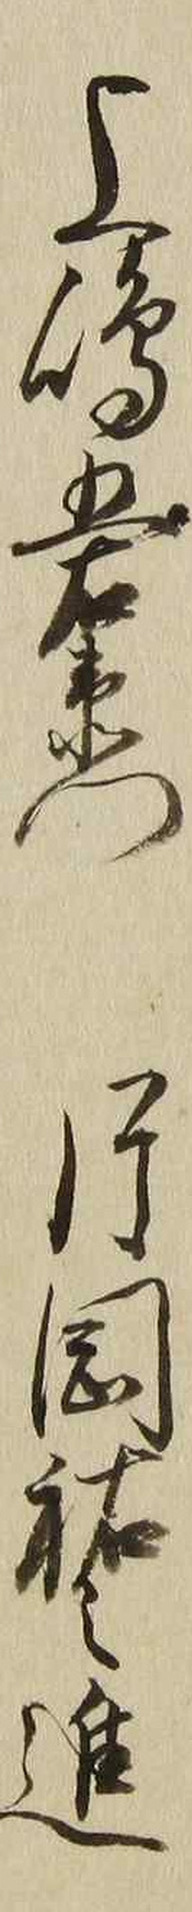上島五右衛門片岡祐之進
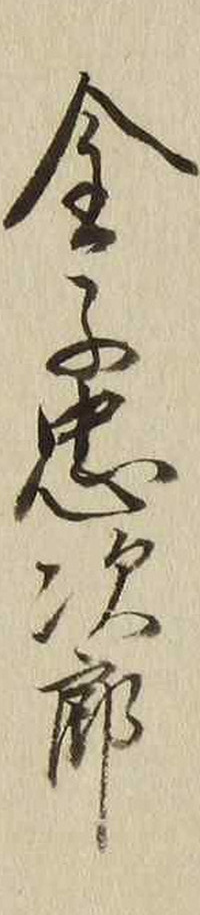金子忠次郎

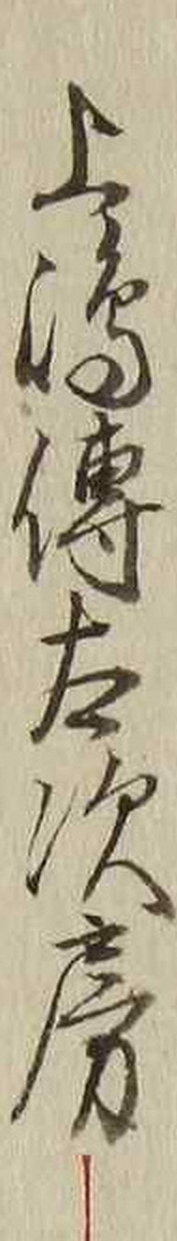上島伝太次房
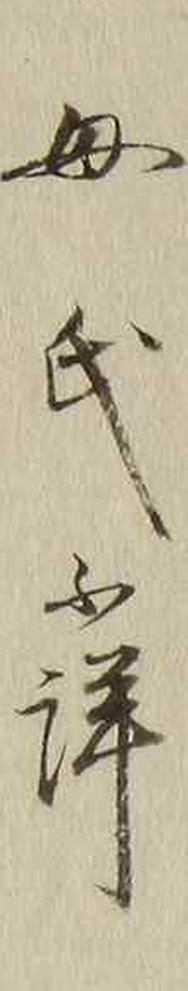母氏不詳
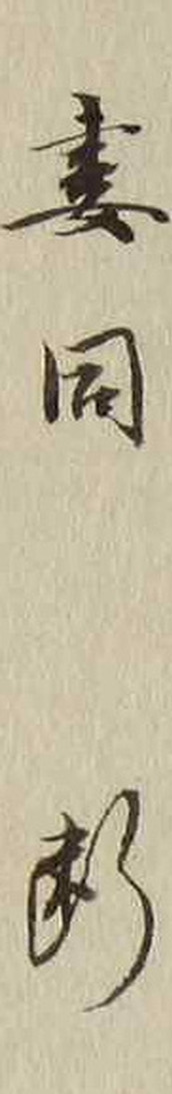妻同断
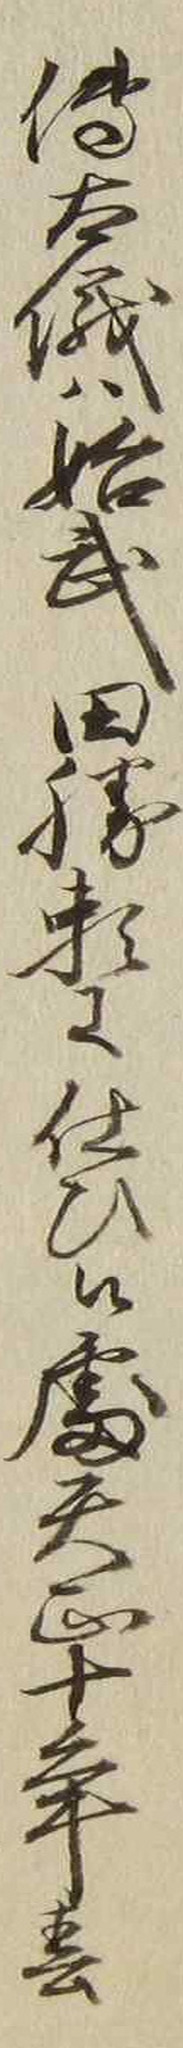伝太儀ハ始武田勝頼に仕ひ候處天正十年春
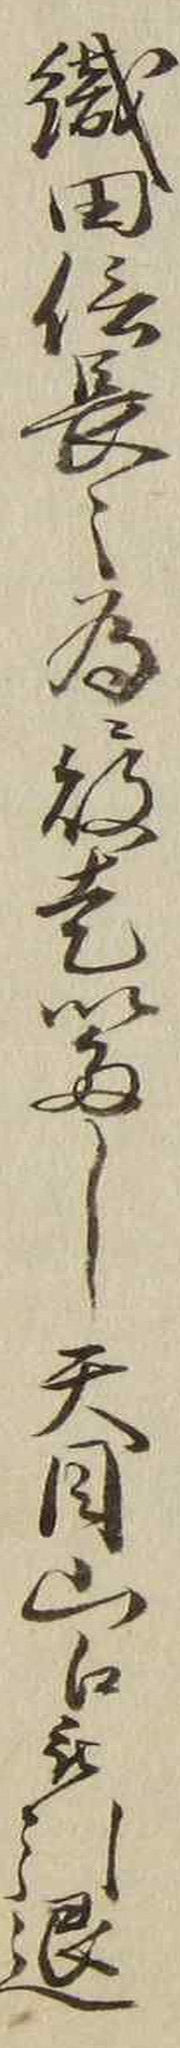織田信長之為ニ敗走いたし天目山江被引退
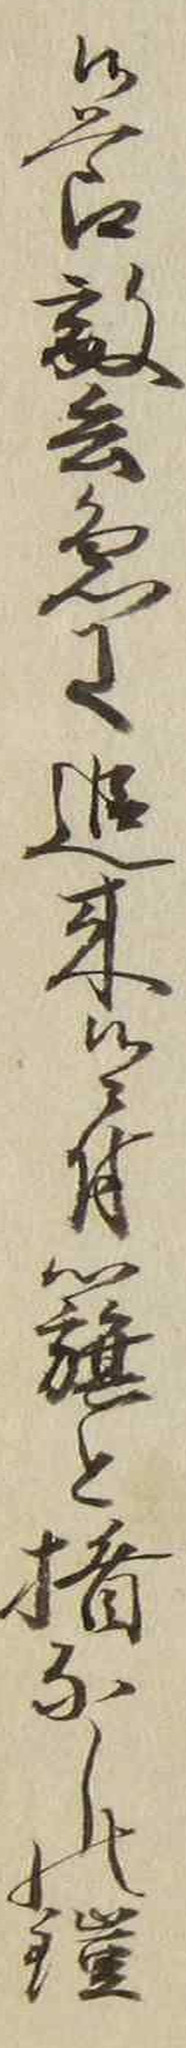候節敵兵急に追来候ニ付籏と指なしの鎧

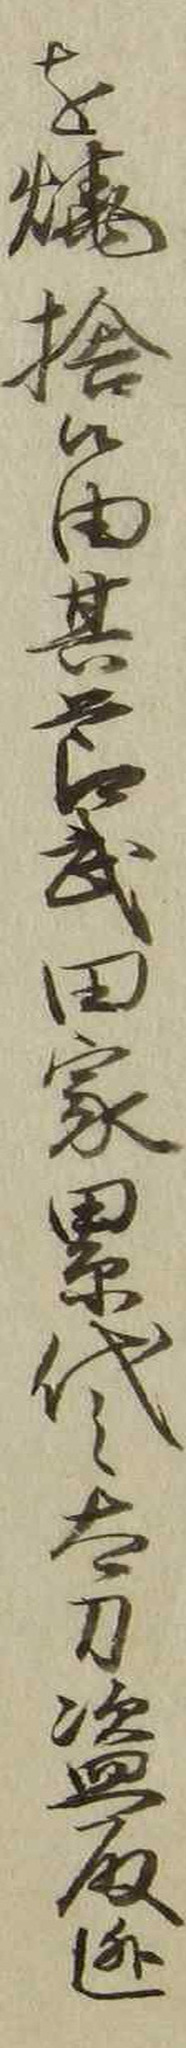を焼捨候由其節武田家累代之太刀盗殿逃
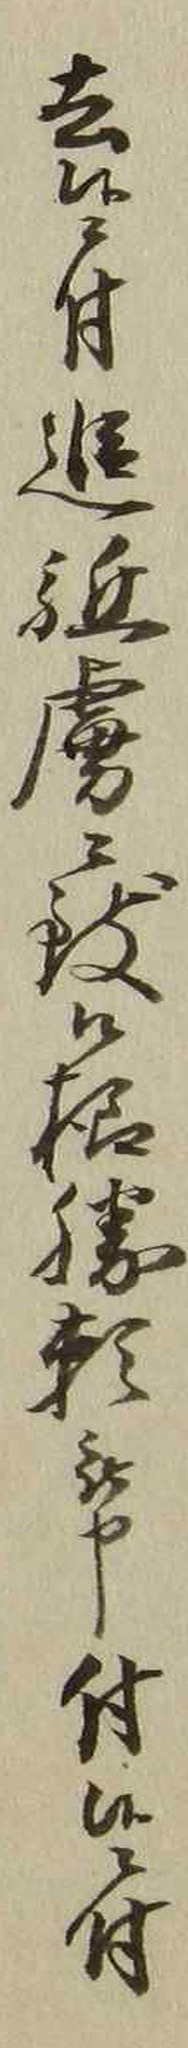去候ニ付追駈虜ニ致候様勝頼被申付候ニ付
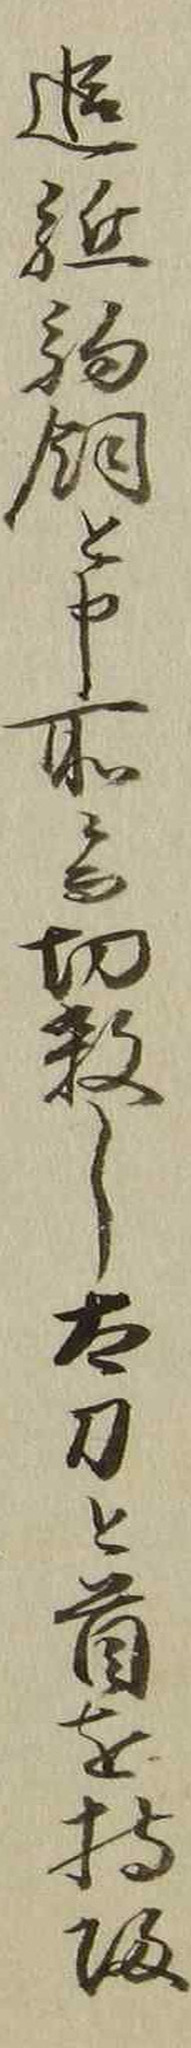追駈駒飼と申所ニ而切殺し太刀と首を持帰
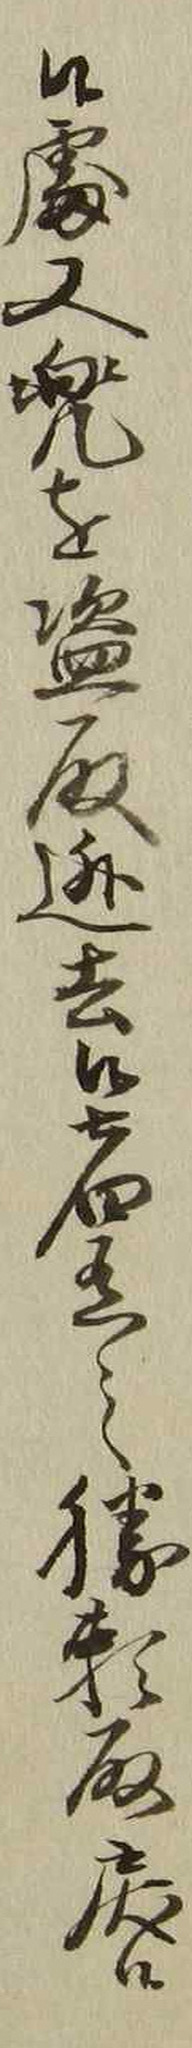候處又兜を盗殿逃去候者有之勝頼殿戻候
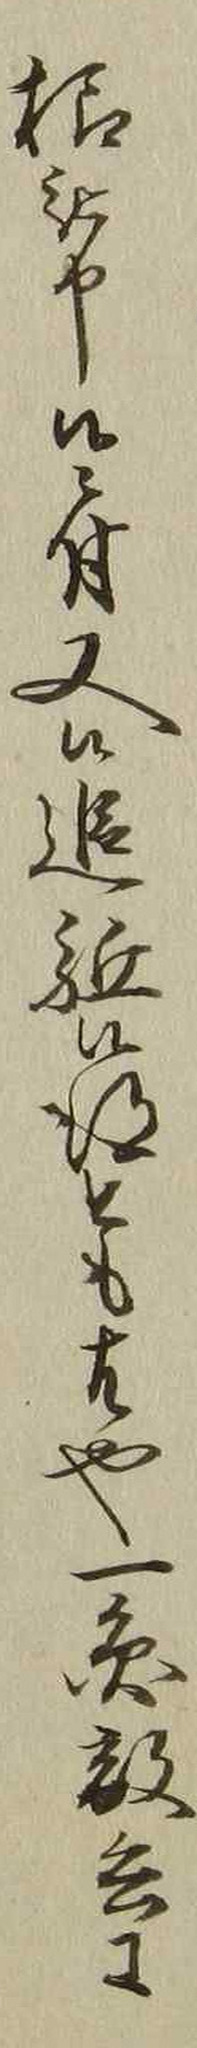様被申候ニ付又候追駈候得ともはや一円敵兵に
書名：諸士系譜　巻之114　か之部22
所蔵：会津若松市立会津図書館
